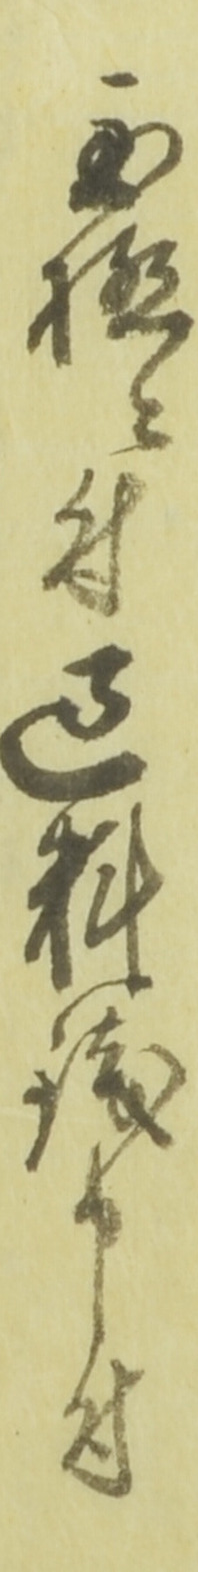至極ニ付過料銭申付
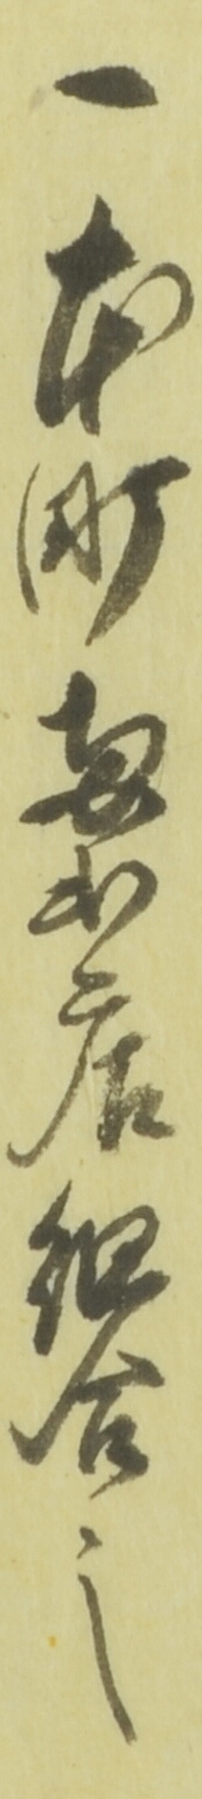一本町両出店組合之
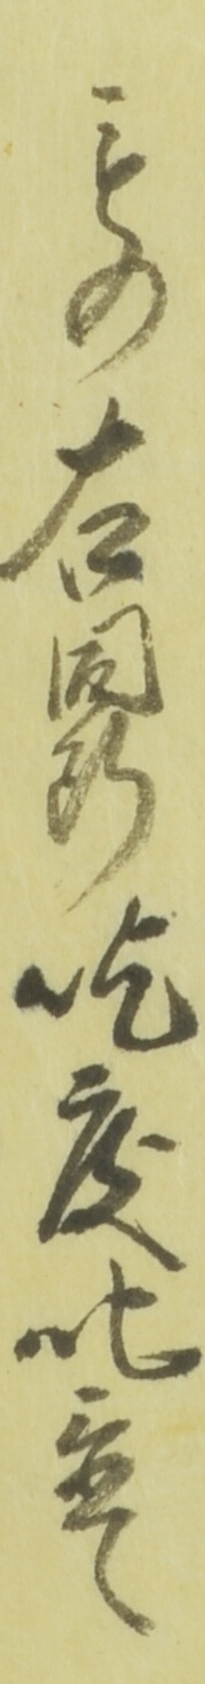もの右同断屹度叱置候
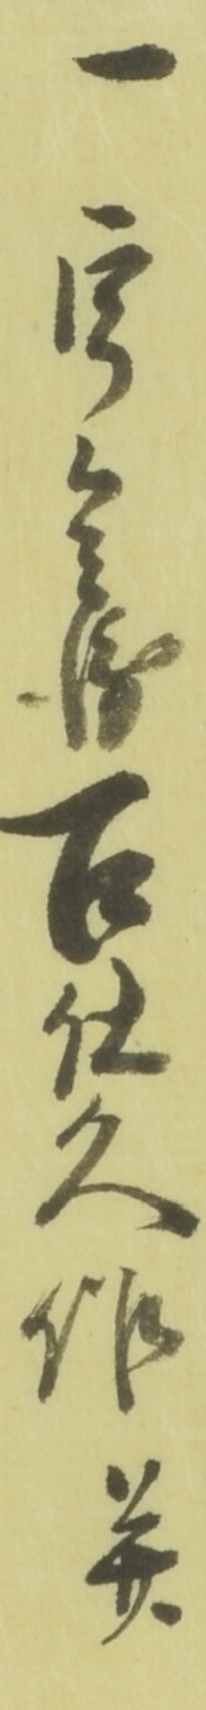一宇兵衛召仕久作并
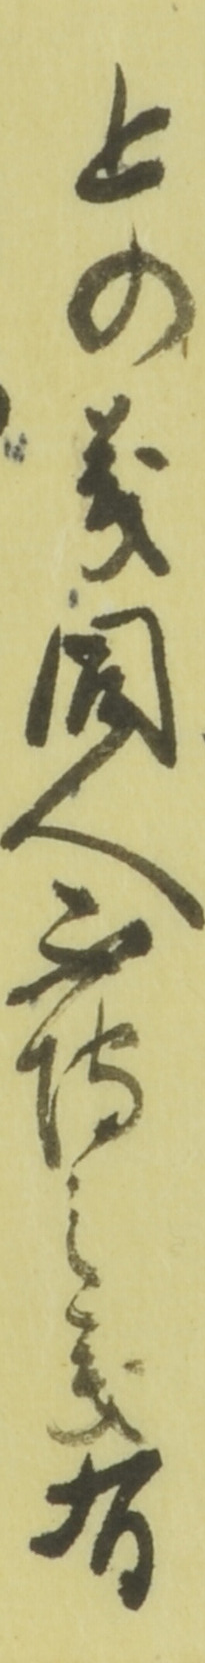との義同人不埒之義有
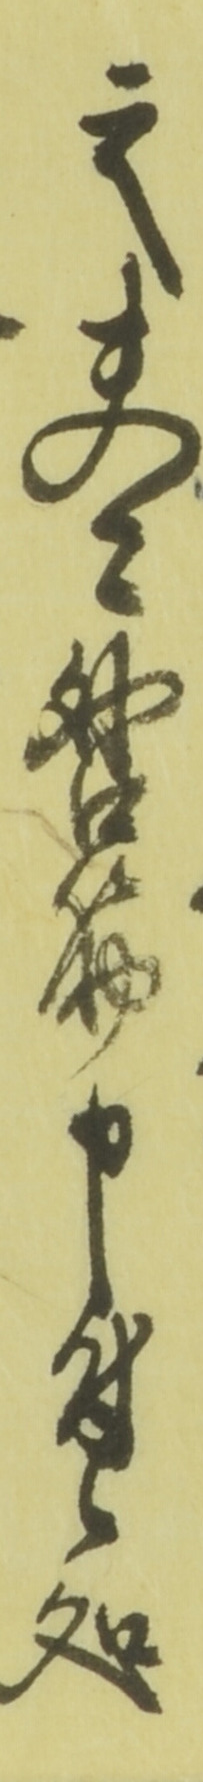之夫々咎筋申付候処
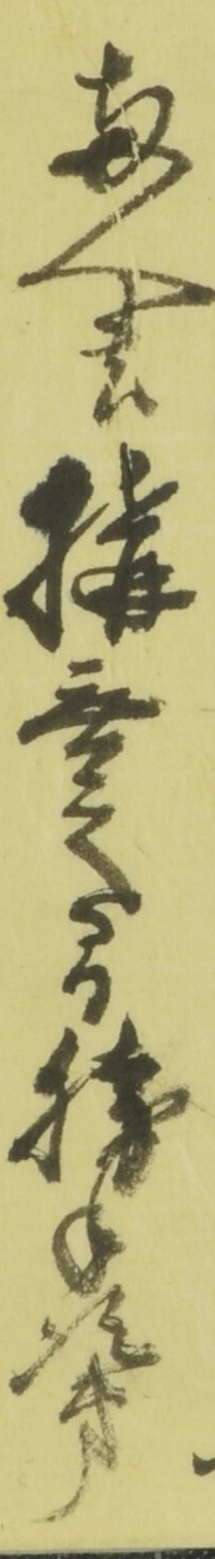両人共構無之間勝手次第
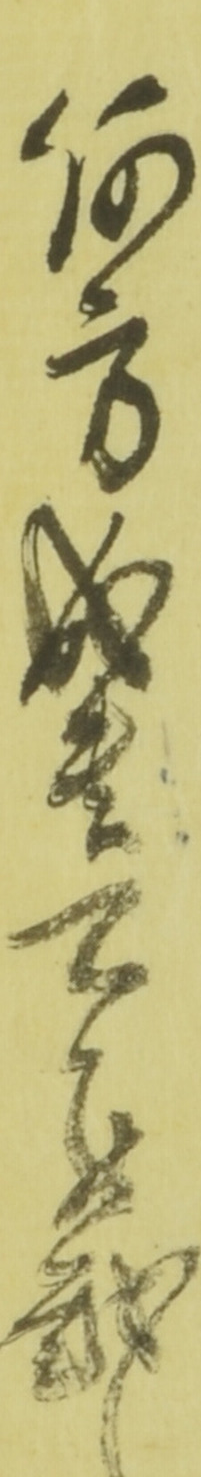何方成共可被越候
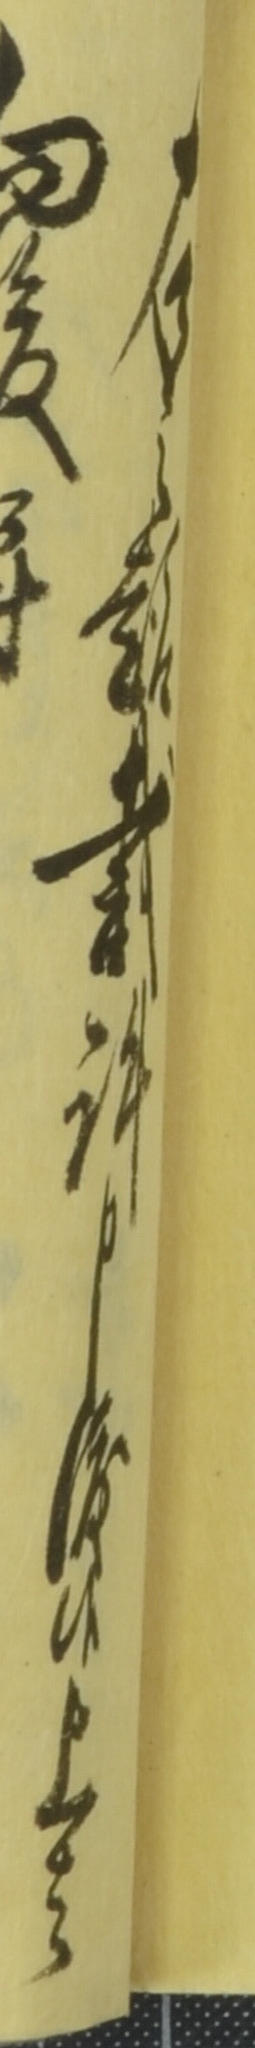右之趣裁許申渡候上は
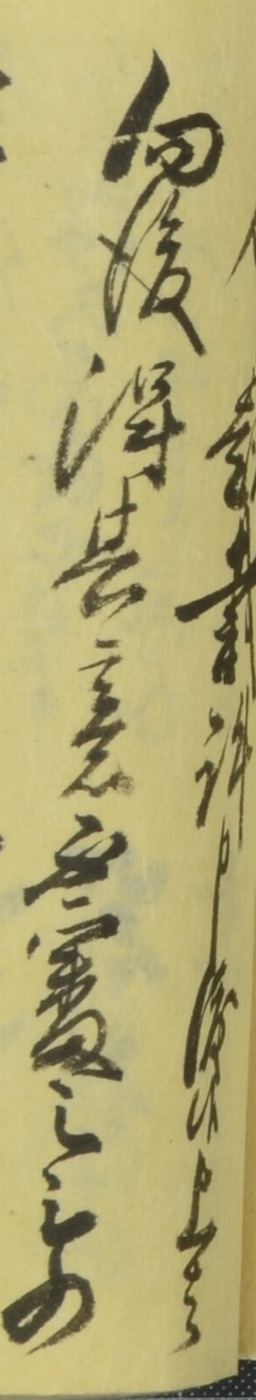向後得共意不審之もの
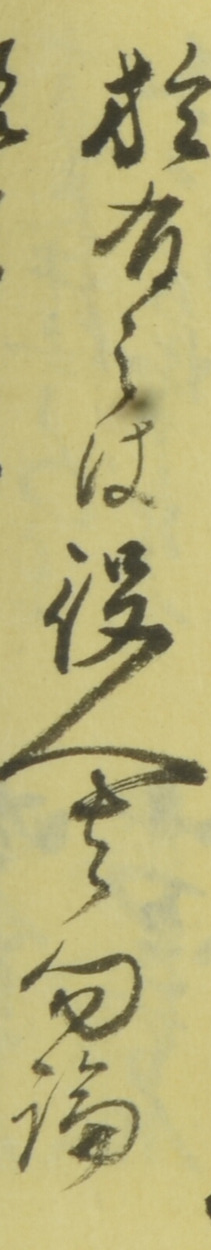於有之は役人は勿論

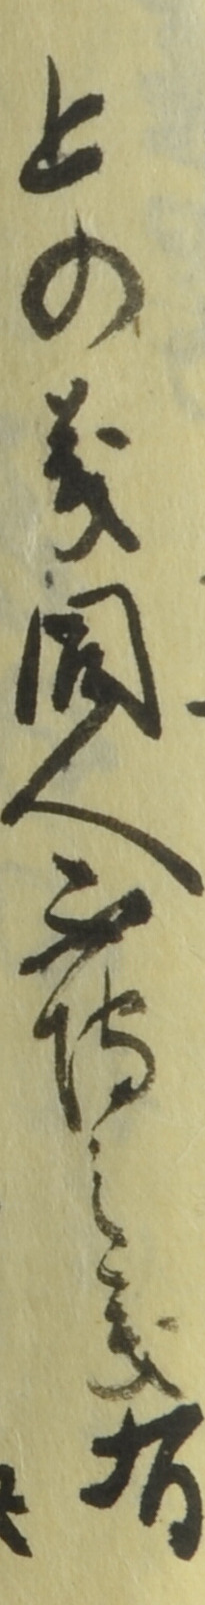との義同人不埒之義有
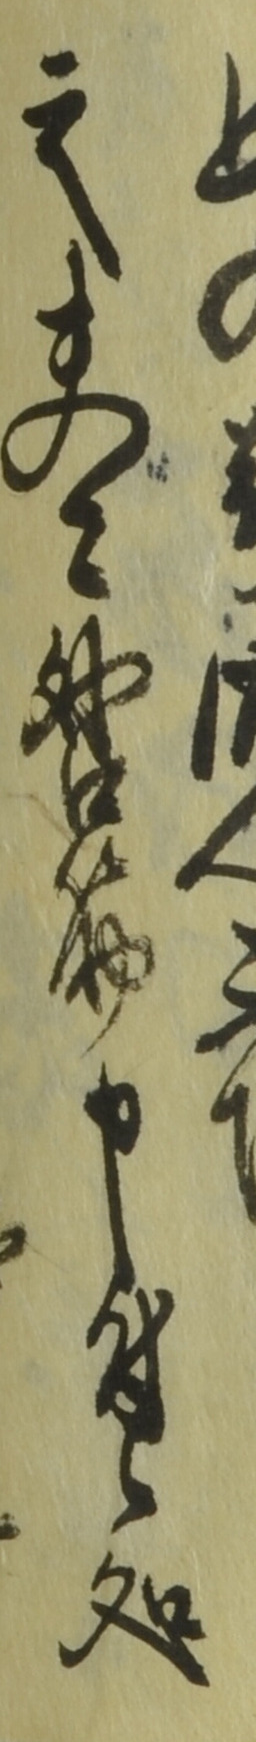之夫々咎筋申付候処
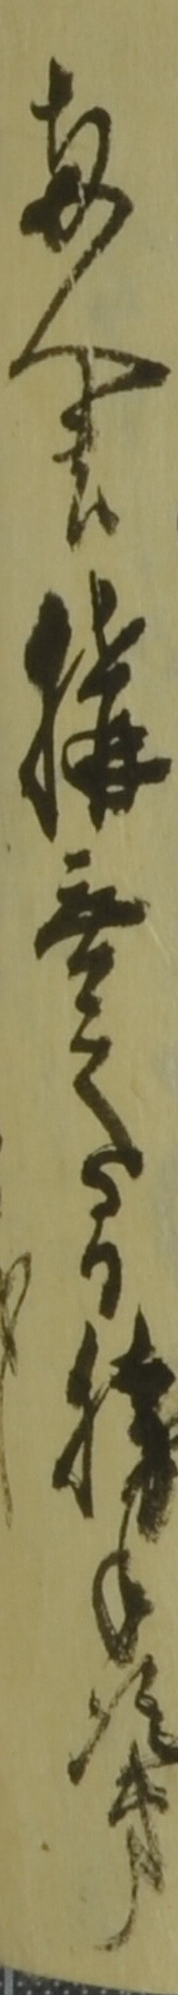両人共構無之間勝次第
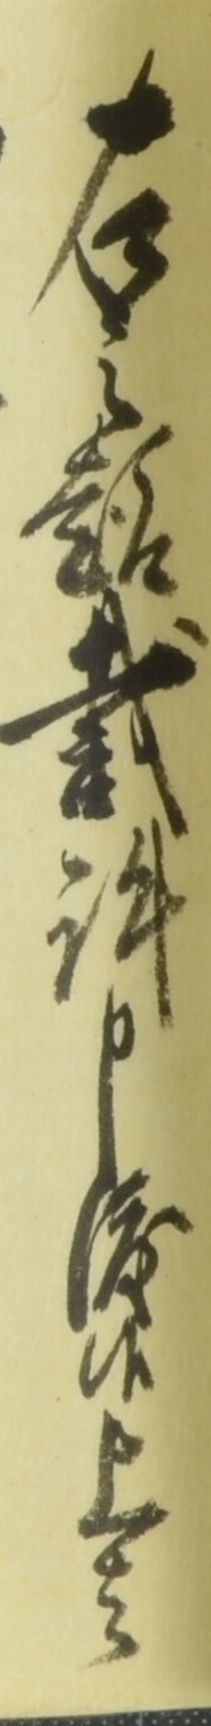右之趣裁許申渡候上は
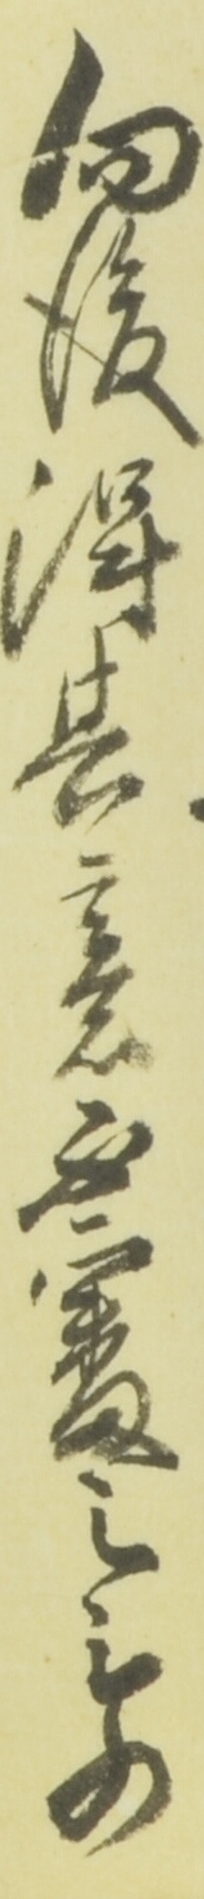向後得共意不審之もの
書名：御触書御書附控
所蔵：伊那市立高遠町図書館・合同会社AMANE
